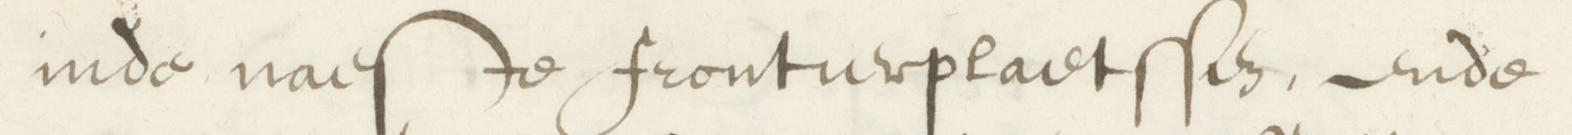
inde naeste frontierplaetssen ende
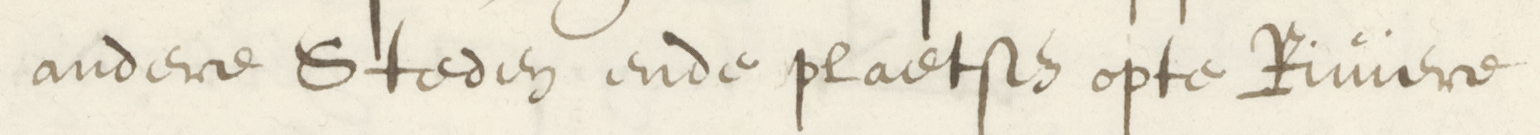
andere steden ende plaetsen opte Riuiere
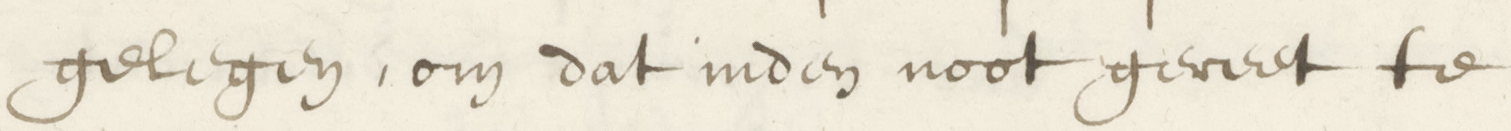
gelegen, om dat inden noot gereet te
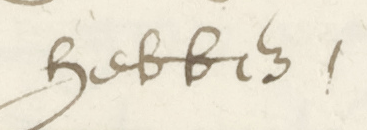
hebben.
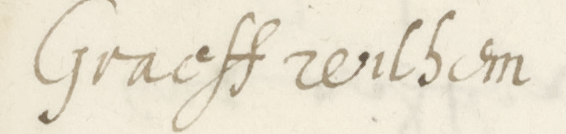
Graeff wilhem
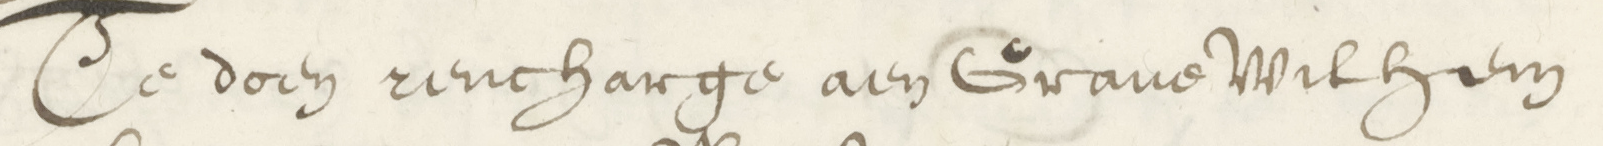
Te doen rencharge aen Graue Wilhem
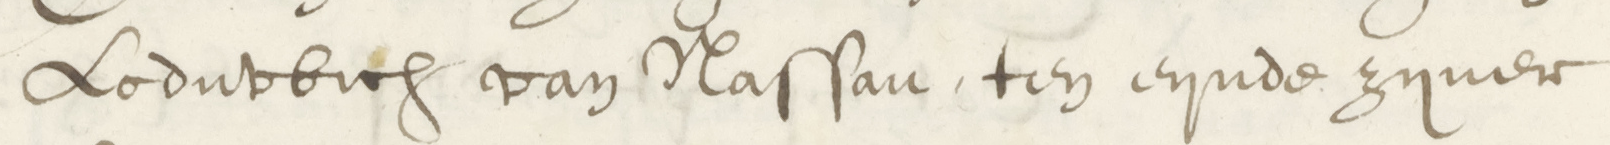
Lodewich van Nassau ten eynde zyner
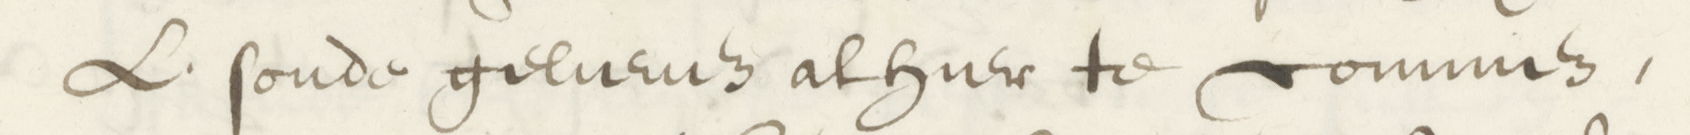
L. soude gelieuen alhier te commen,
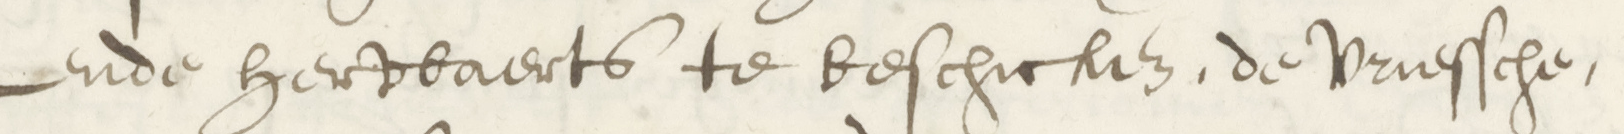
ende herwaerts te beschicken, de Vriessche,
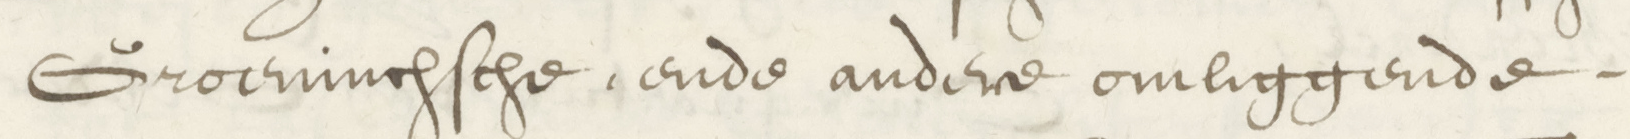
Groeninchsche, ende andere omliggende
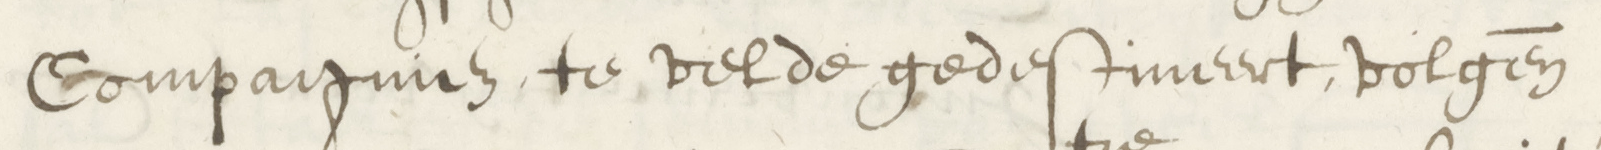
compaignien te velde gedestineert, volgen
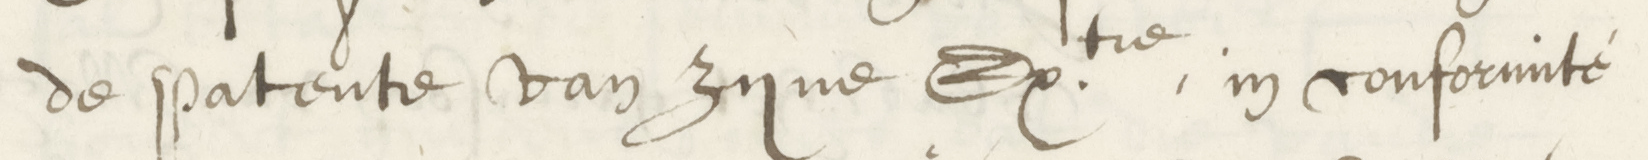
de patente van zijne Ex.tie, in conformité
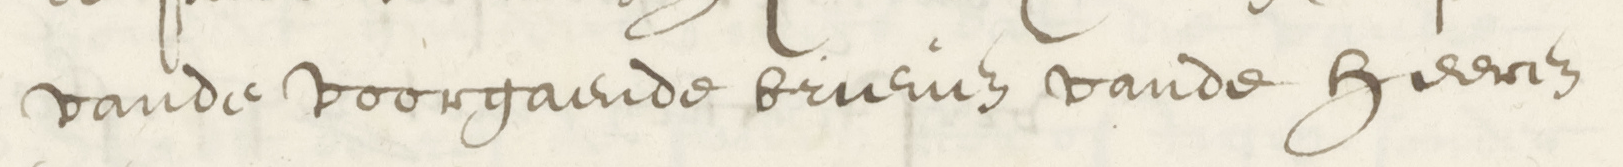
vande voorgaende brieuen vande heeren
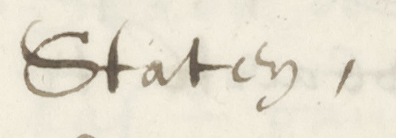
Staten.
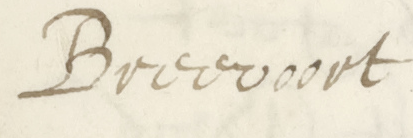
Breevoort
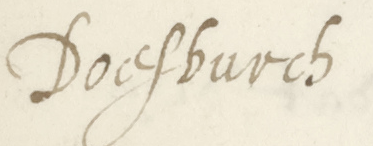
Doesburch
